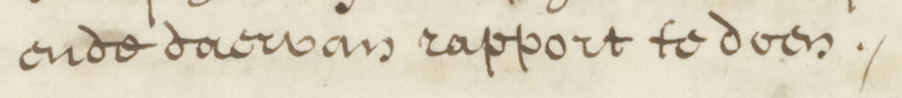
ende daervan rapport te doen.
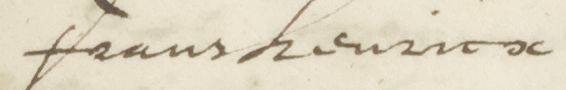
Frans Henricx
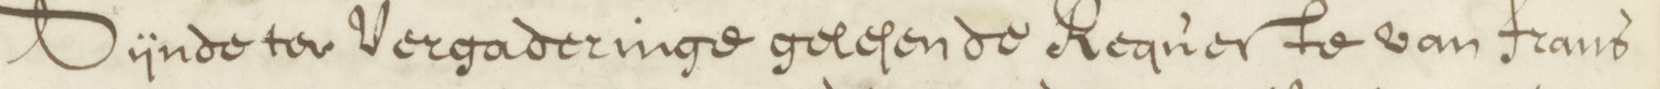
Sijnde ter Vergaderinge gelesen de Requeste van Frans
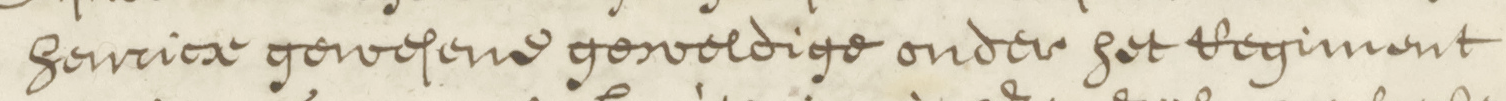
Henricx gewesene geweldige onder het Regiment
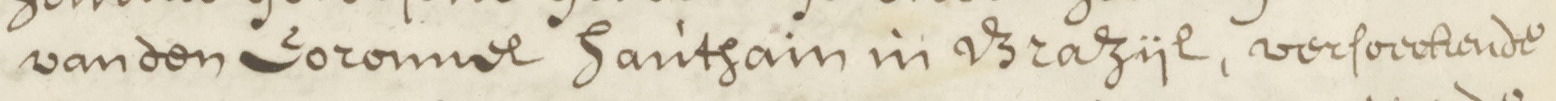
van den Coronnel Hauthain in Brazijl, versoeckende
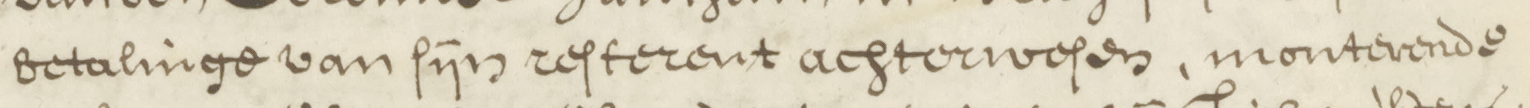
betalinge van sijn resterent achterwesen, monterende
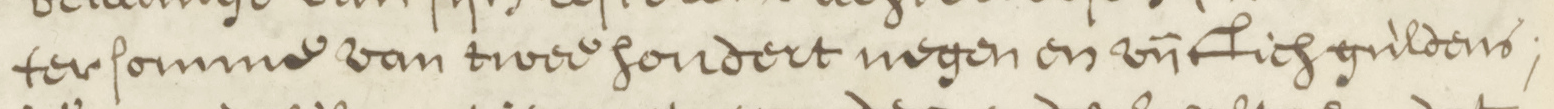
ter somme van twee hondert negen en vijftich guldens;
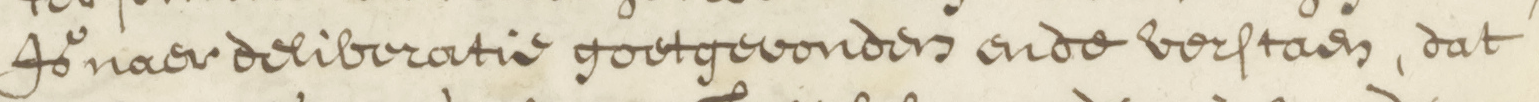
Is naer deliberatie goetgevonden ende verstaen, dat
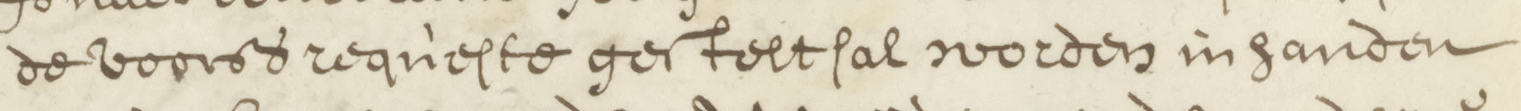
de voors requeste gestelt sal worden in handen
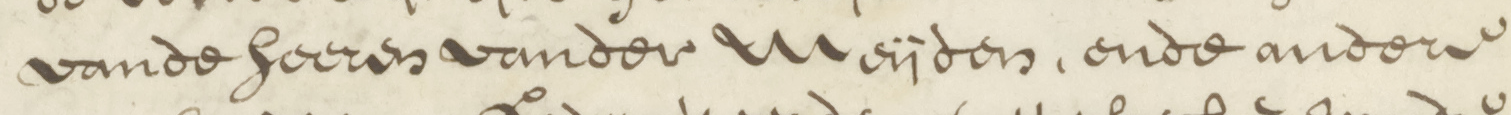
vande heeren vander Meijden, ende andere
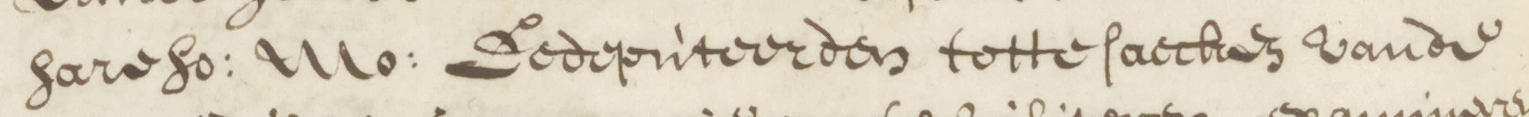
hare ho:Mo: Gedeputeerden totte saecken vande
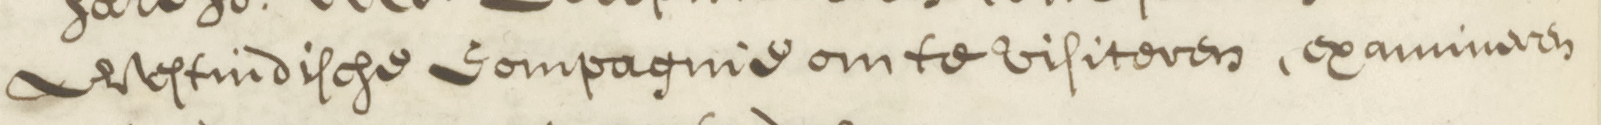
Westindische Compagnie om te visiteren, examineren
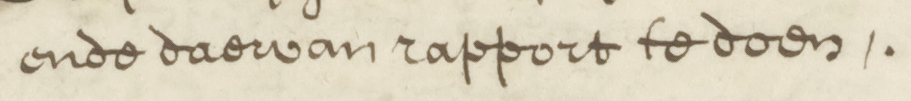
ende daervan rapport te doen.
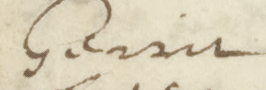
Gerrit
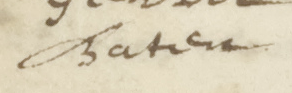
Baten
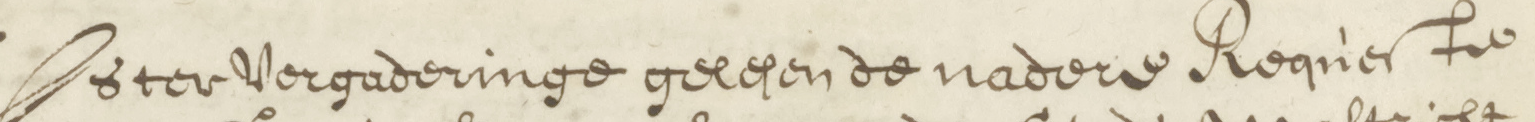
Is ter Vergaderinge gelesen de nadere Requeste
